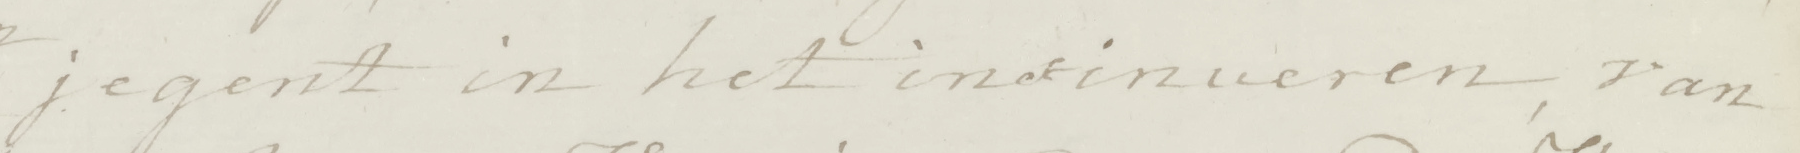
jegent in het insinueren, van
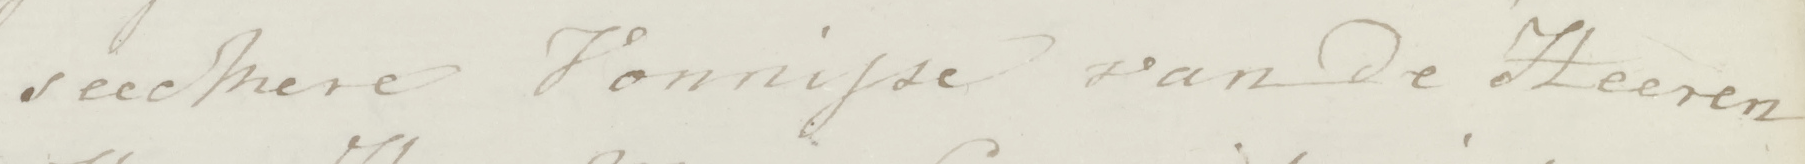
seeckere Vonnisse van de Heeren
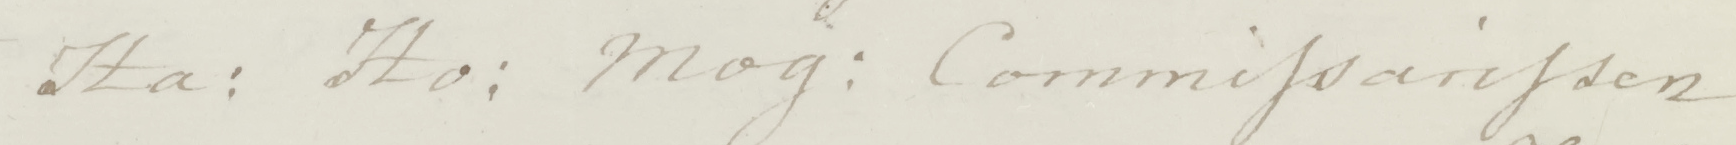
Ha: Ho: Mog: Commissarissen
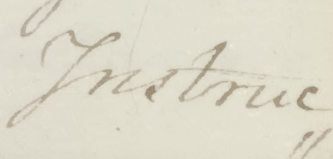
Instruc„
